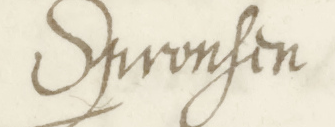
Spronsen
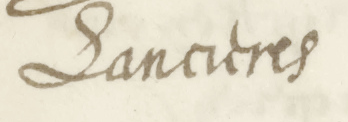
Lancieres
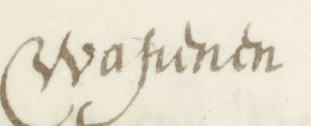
Wapenen
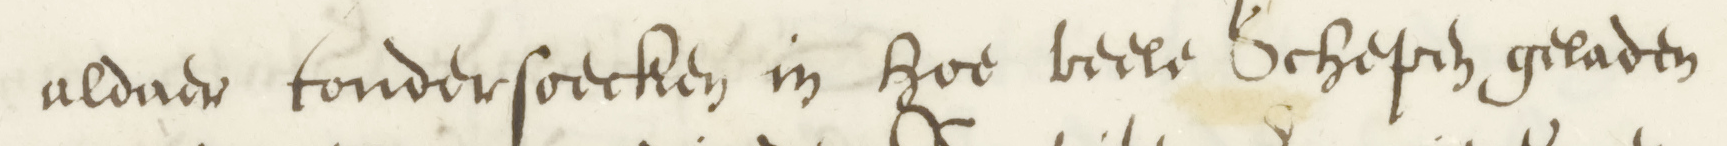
aldaer tondersoecken in hoe veele schepen geladen
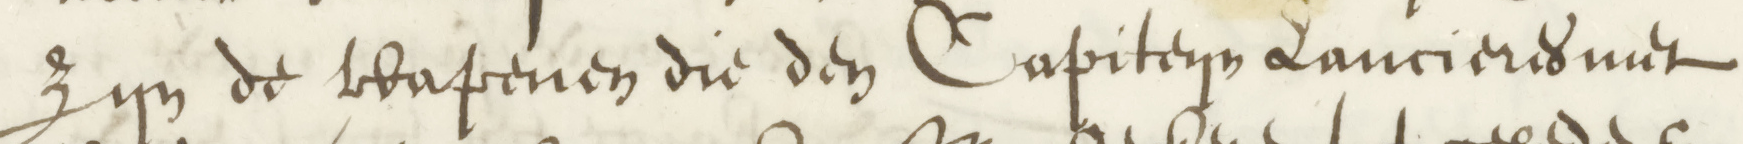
zyn de wapenen die den Capiteyn Lanciers met
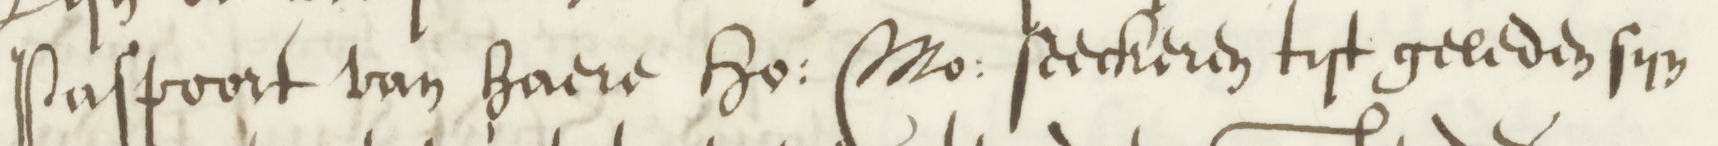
paspoort van haere Ho:Mo: seeckeren tyt geleden syn
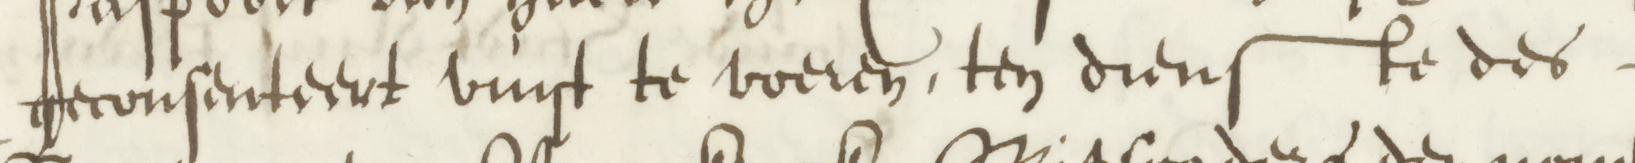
geconsenteert vuyt te voeren, ten dienste des
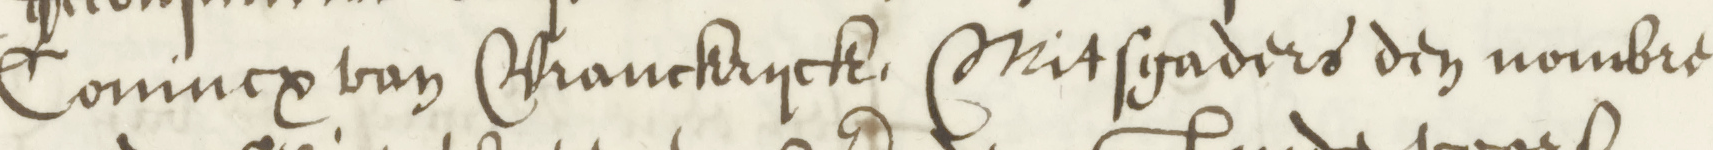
Conincx van Vranckryck, mitsgaders den nombre
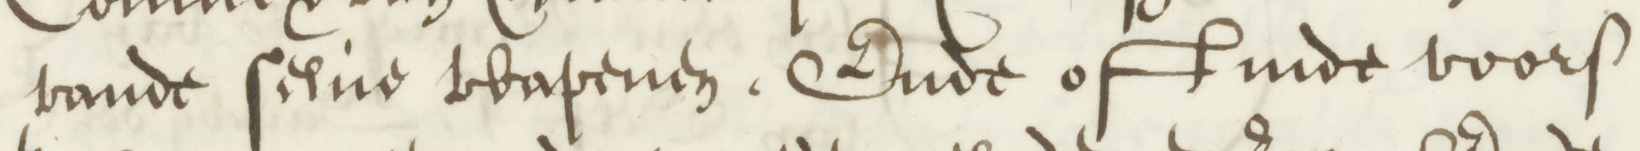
vande selue wapenen. Ende off inde voors
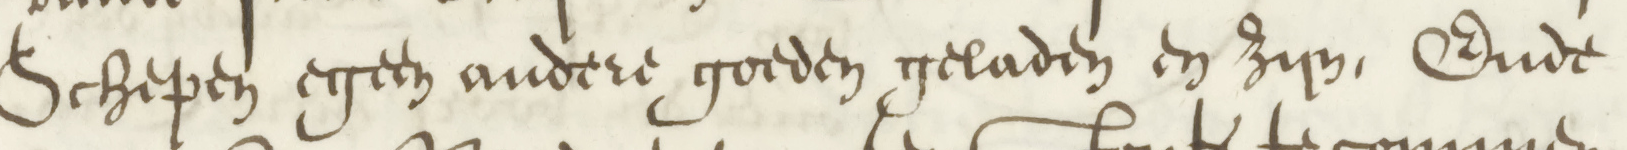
Schepen egeen andere goeden geladen en zyn. Ende
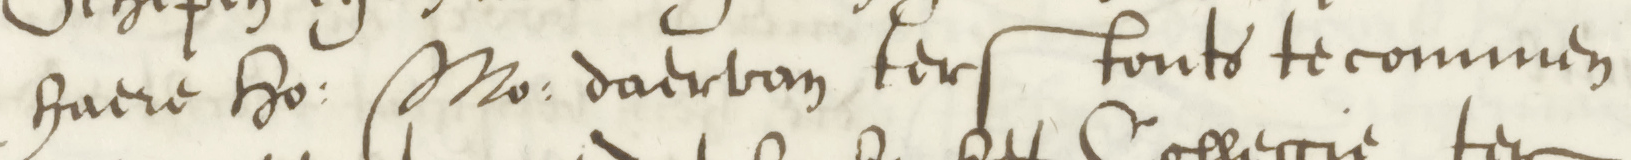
haere Ho:Mo: daervan terstonts te commen
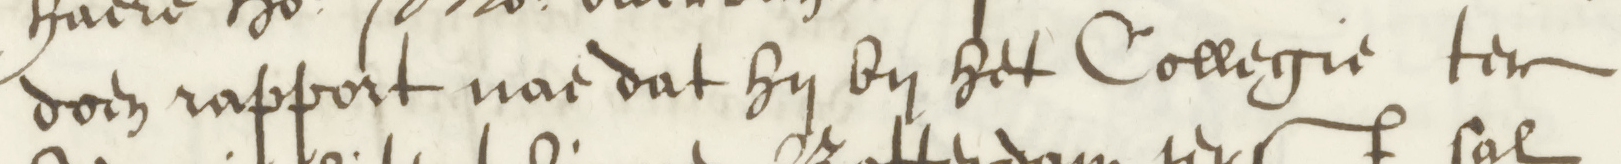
doen rapport nae dat hy by het Collegie ter
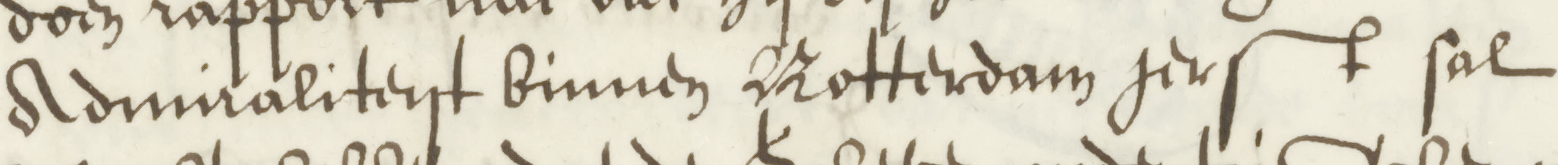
Admiraliteyt binnen Rotterdam ierst sal
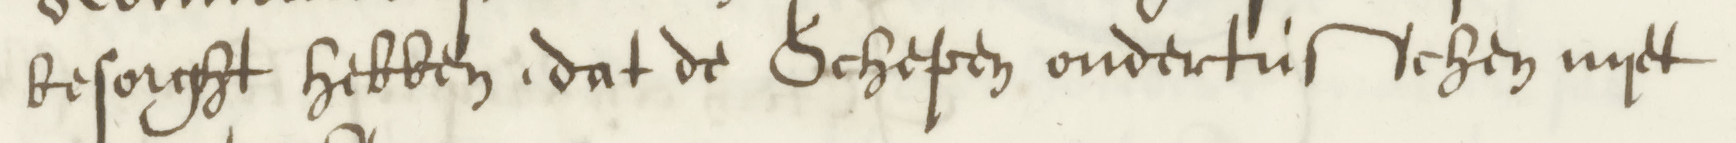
besorght hebben, dat de Schepen ondertusschen nyet
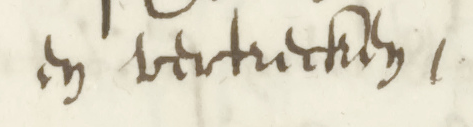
en vertrecken.
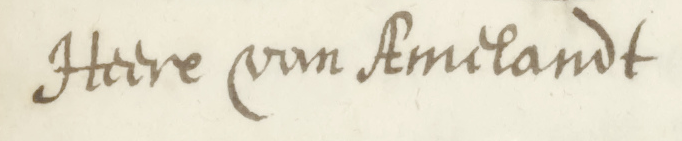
Heere van Amelandt
